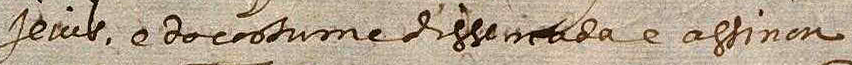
Jeiūs, e do costume disse nada e assinou
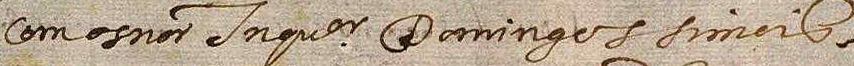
com o snōr Inquo.r Domingos simois̄
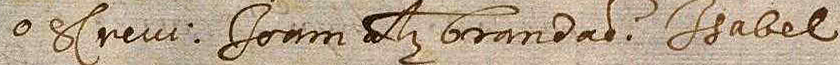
o escreui: Joam al̄z brandaõ. Jsabel
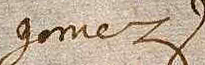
gomez
